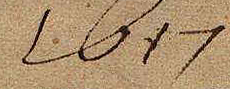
1617
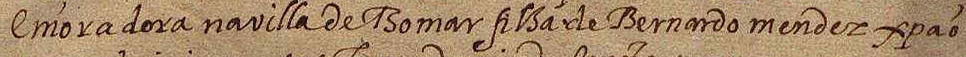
e moradora na villa de Thomar filha de Bernardo mendez xpaõ
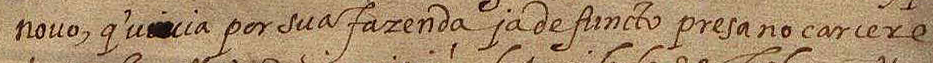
nouo, q̄ uiuia por sua fazenda ja defuncto presa no carcere
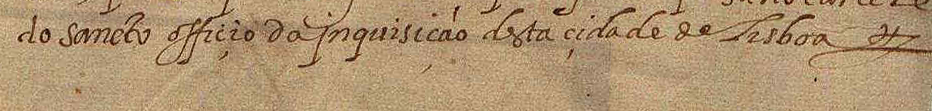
do sancto officio da Jnquisiçaõ desta cidade de Lisboa ttꝭ
